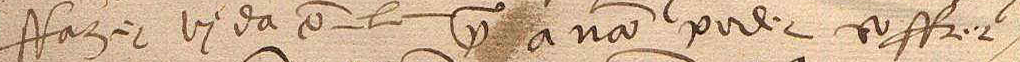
ffazer vyda c̄o ele p̄o a não poder soffer /
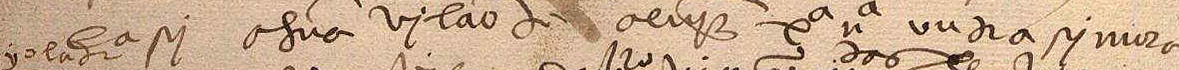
e asy a huā vjlaōte alur̄z xa na outra sy mora
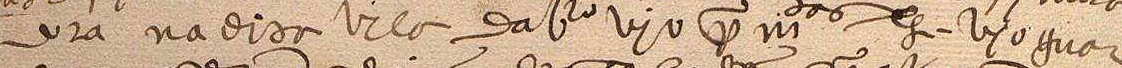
dora na dita vyla davro vyo p̄o mtas lhe vyo guar
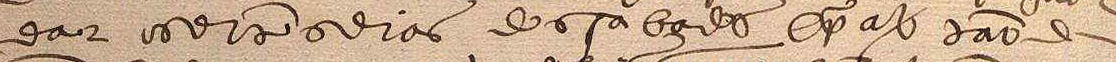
dar os ditos dias dos sabados e p̄o a ꝟ tão de
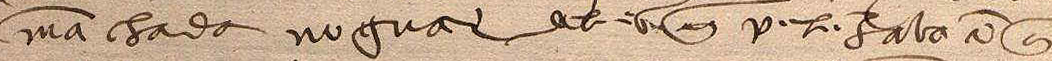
m̄achada no guar deles q̄ peleJava c̄o q̄
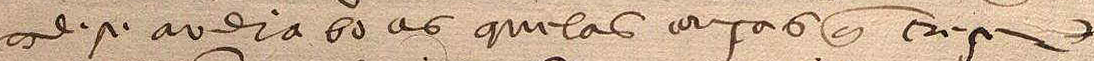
a dese ao diabo as quelas cousas q̄ crese ē
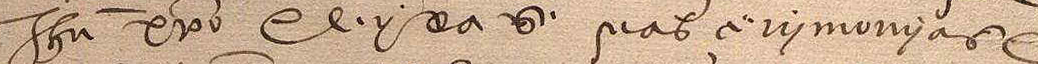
Jhū xp̄o e deyxase suas çerymonyas e
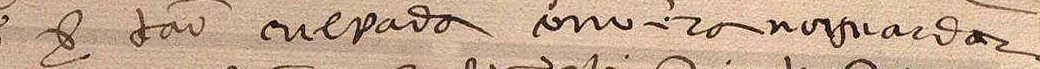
p̄o ꞩ tão culpada como era no guardar
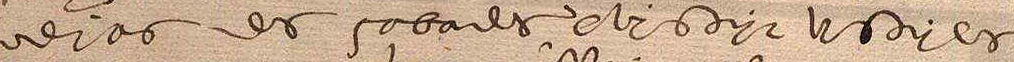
o dias dos sabados e vystyr vjstydos
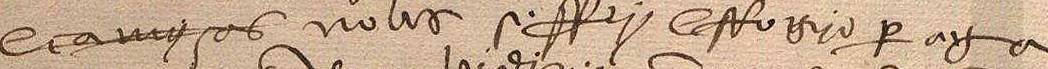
e camysas novos se ffoy e ffogyo ꝑ a ga
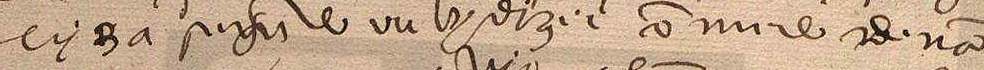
lyza segūdo ouvy dizer c̄o medo de não
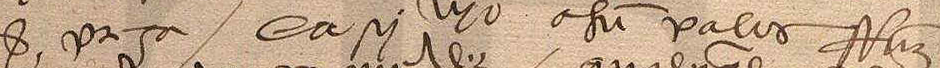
ꞩ presa / e asy vyo a hū palos ffrr̄z
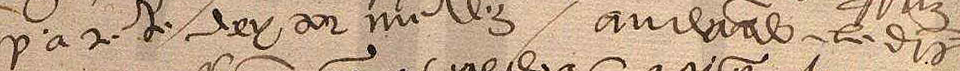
parete de eytor medez / andar̄do ele djto
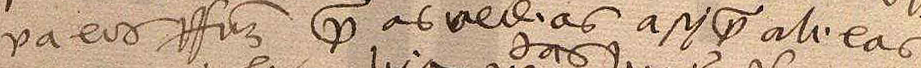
palos ffrr̄z p̄o as aldeas asy p̄o avelas
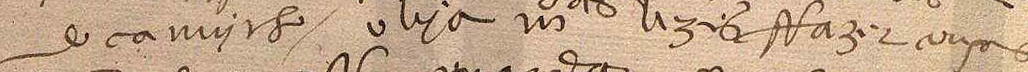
do camynho / o vya mtas vezes ffazer cousas
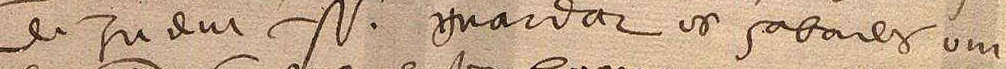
de Judeu -ss. guardar os sabado om
